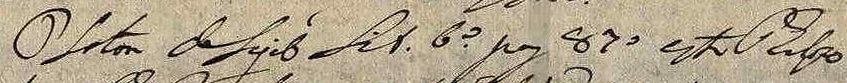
PLaton de Legib Lib. 6.o pag 870 este Philozo
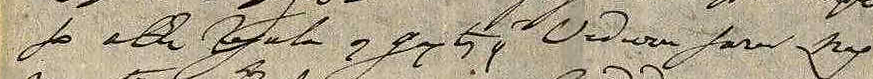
fo athe Regula os gastos q̄ se deven fazer nas
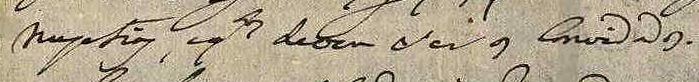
Nuptias, e q.tos deven ser os Convidados.
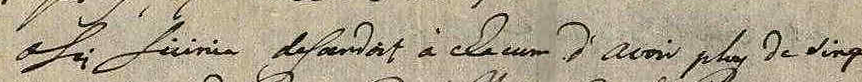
a Lei Licinia defandoit á chacum d'avoir plus de sinq
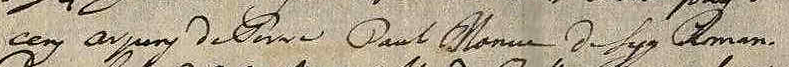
cens arpens de Terre Paul Manuc de Leges Roman.
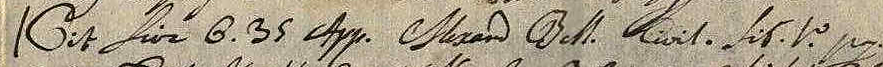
Tit Livi 6. 35 App. Alexand Bell. Civil. Lib. 1.o pag.
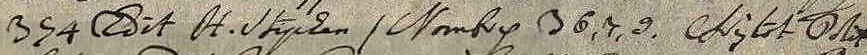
354 Edit H. Stiphen / Nombres 36, 7, 9. Aristot Polit
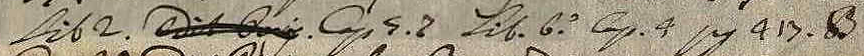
Lib 2. odit Paris. Cap 5. 7 Lib. 6.o Cap. 4 pg 417. B
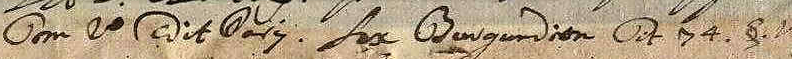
Com 2o edit Paris. Lex Burgundion Tit 74. §. 2.
